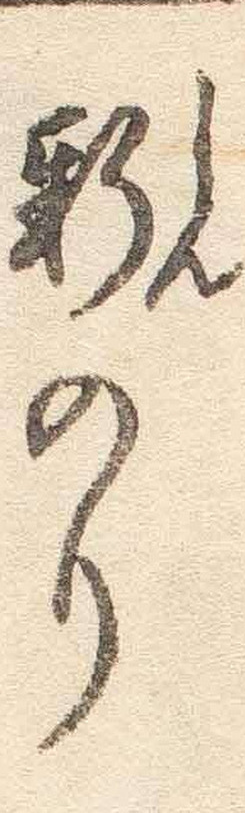新のり
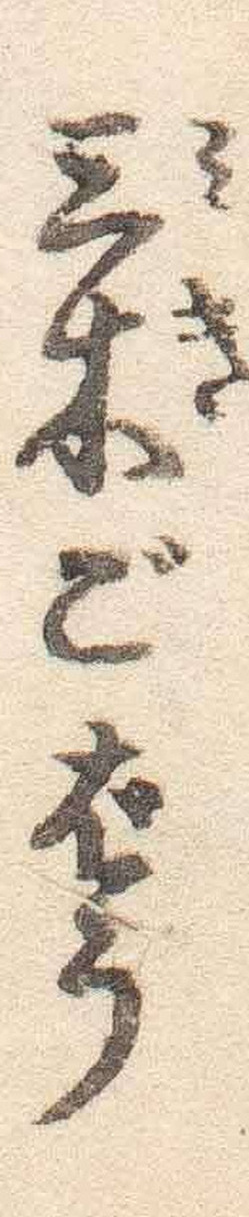三木ごばう
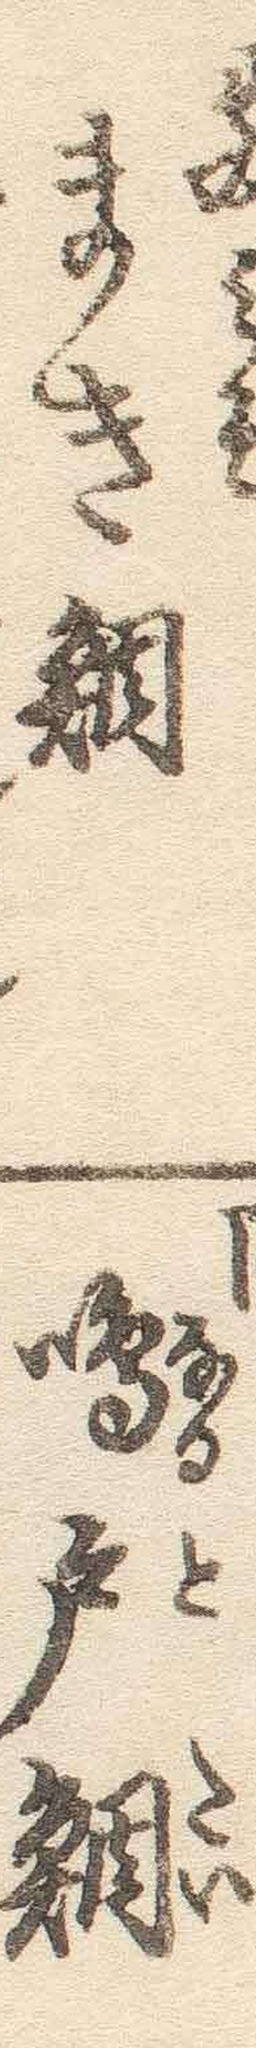春まき鯛鳴門鯛
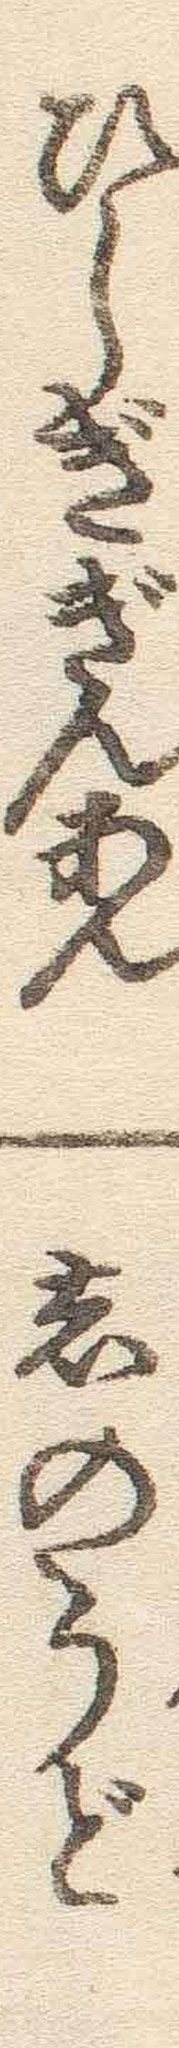ひしぎぎんあんしのうど
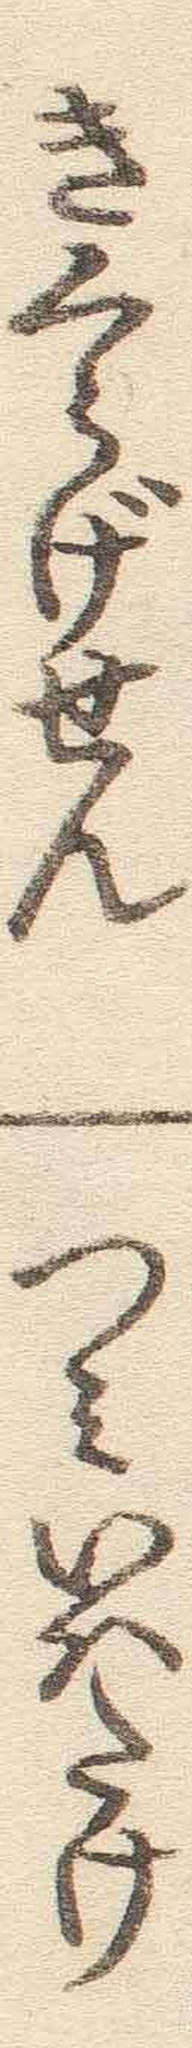きくらげせんつみいはたけ
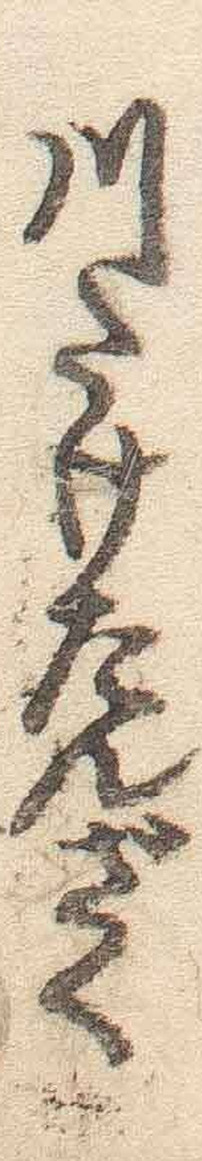川たけたんざく
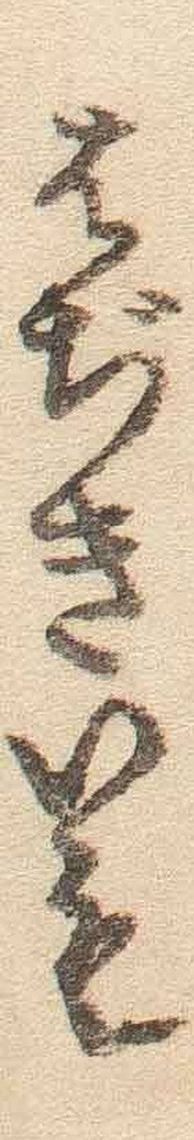はぢきまめ
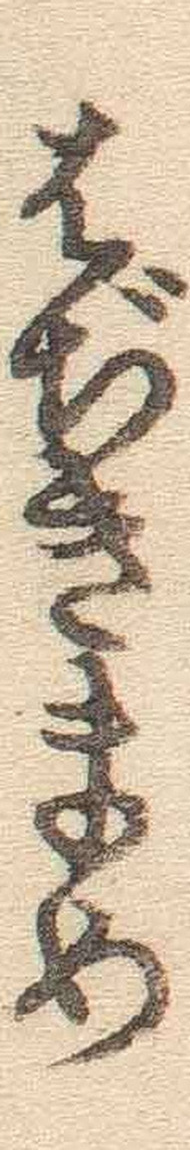はぢきまめ

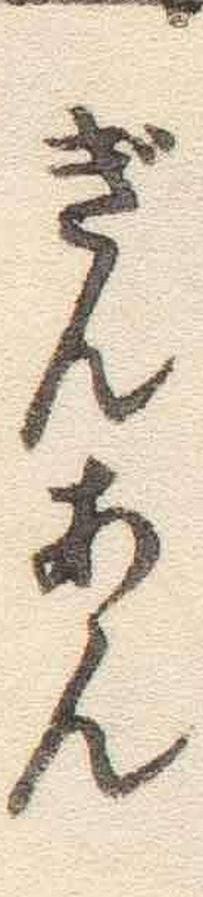ぎんあん
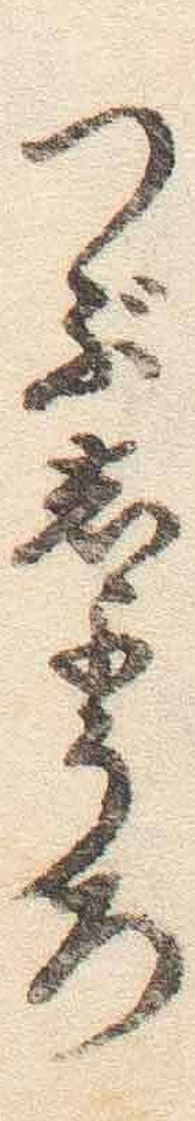つぶしようろ
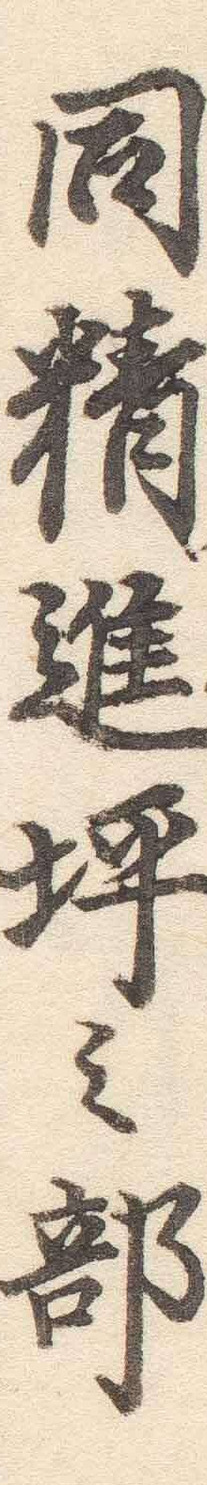同精進坪之部
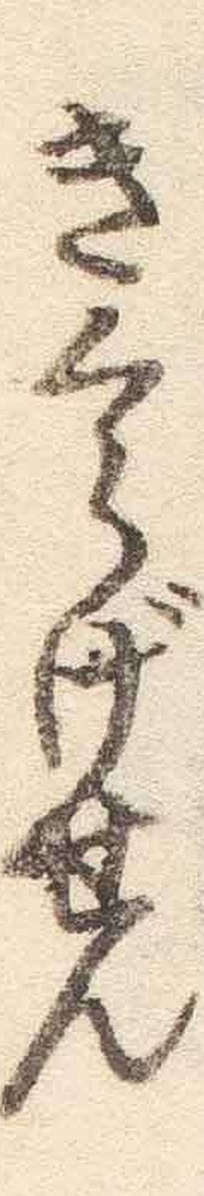きくらげせん
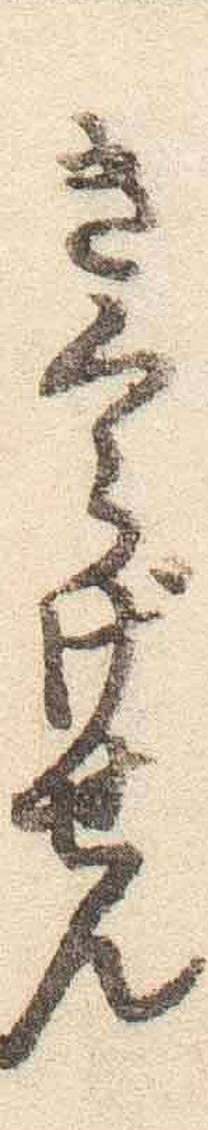きくらげせん
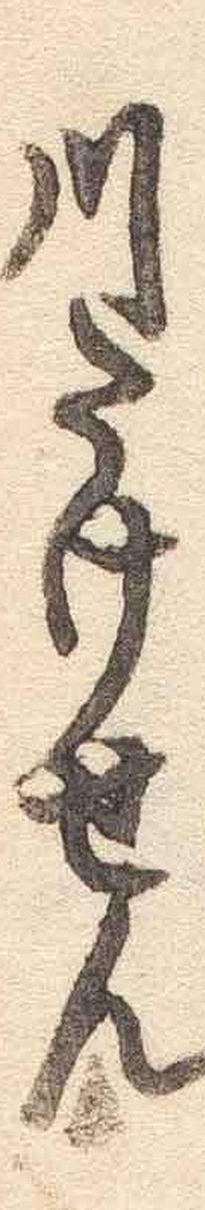川たけせん
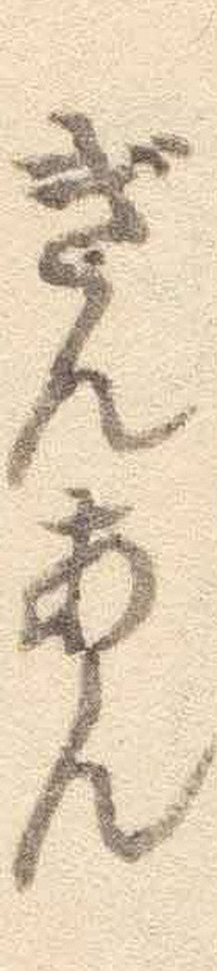ぎんあん
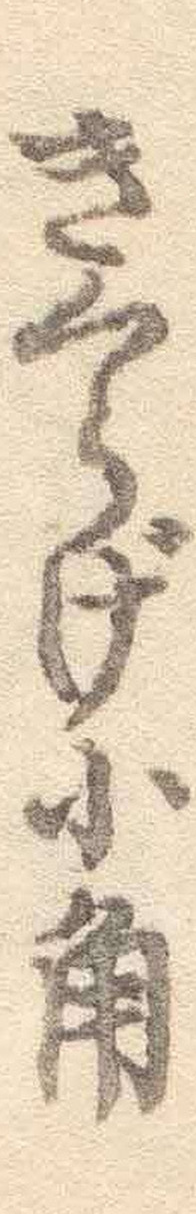きくらげせん
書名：料理通
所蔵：東京学芸大学附属図書館 国文学研究資料館
